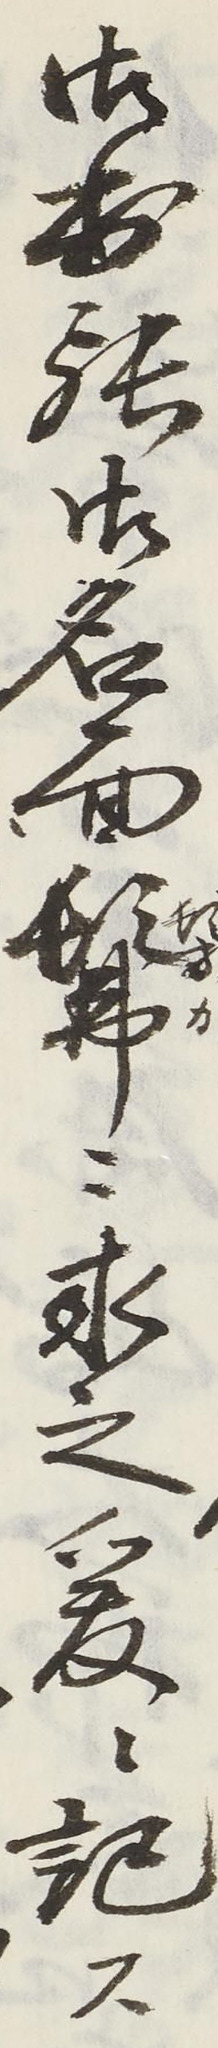御出張御名面髴二求之爰二記ㇲ
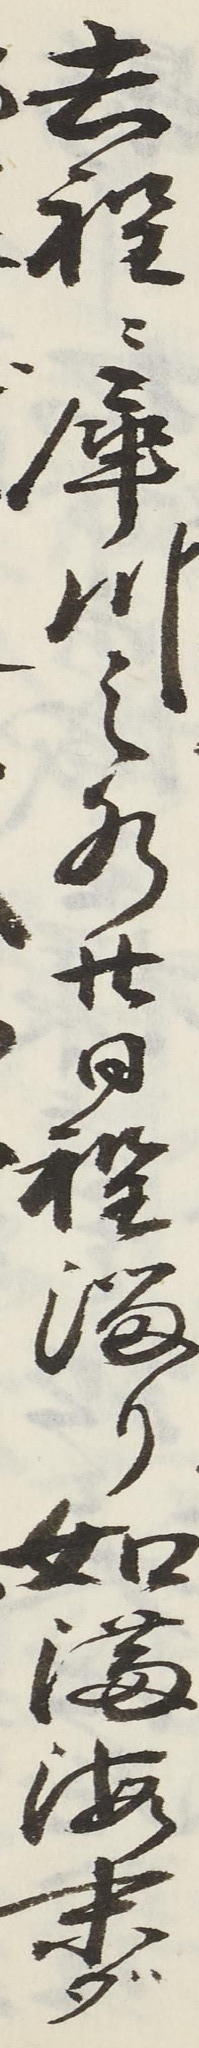去程二犀川之水廿日程溜り如満海未ダ
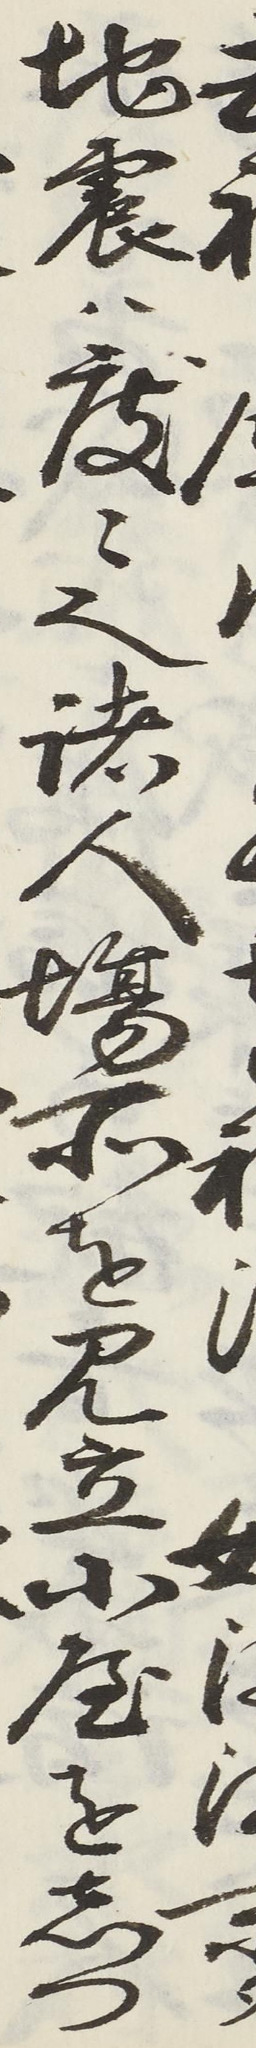地震ハ度々也諸人場所を見立小屋をしつ
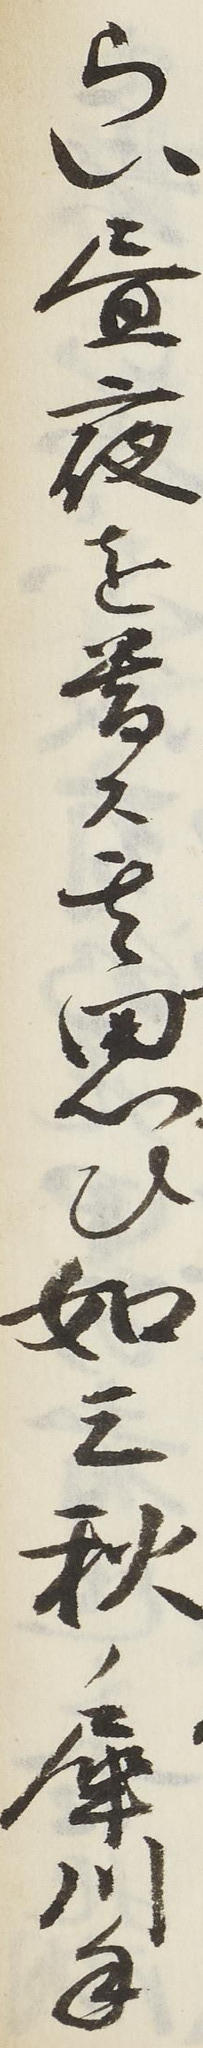らい昼夜を暮ㇲ其思ひ如三秋ノ犀川手

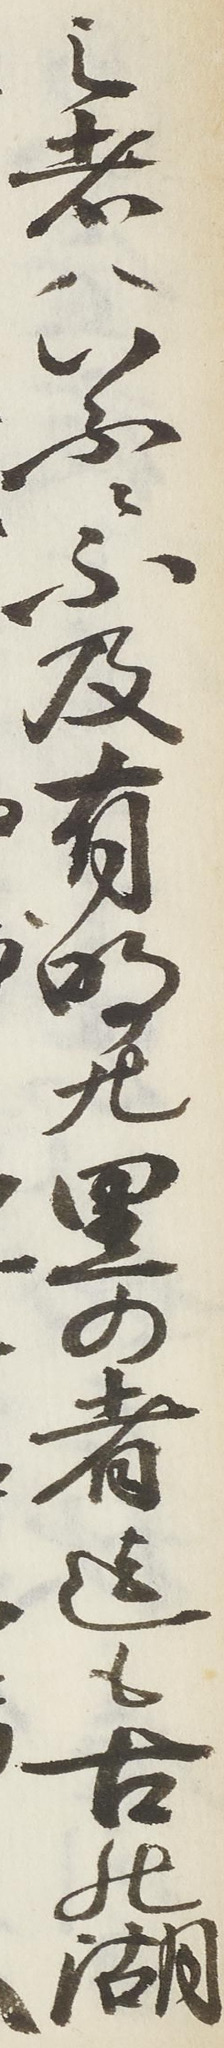之者ハいふに不及有明の里の者迄も古の湖
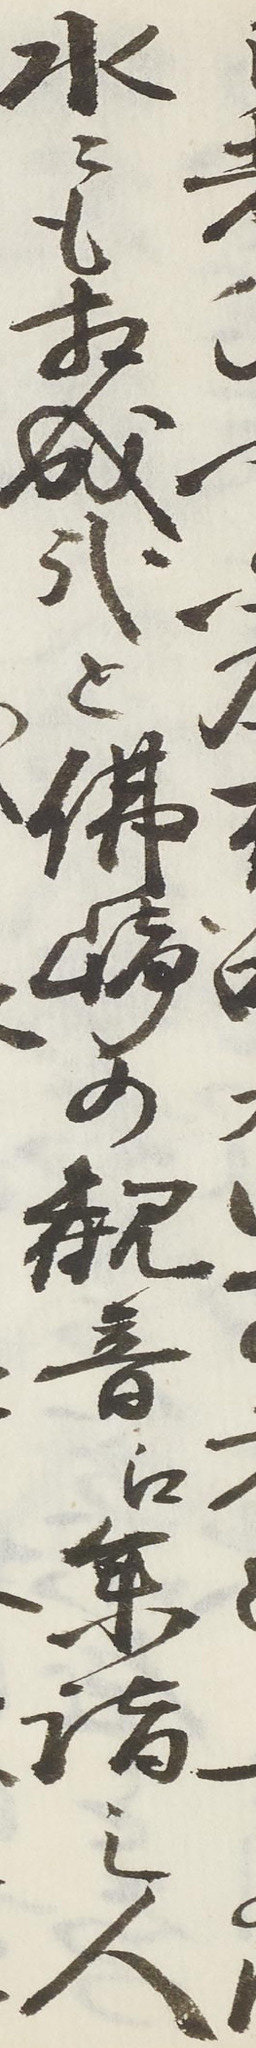水二も相成哉と仏崎の観音江参詣之人
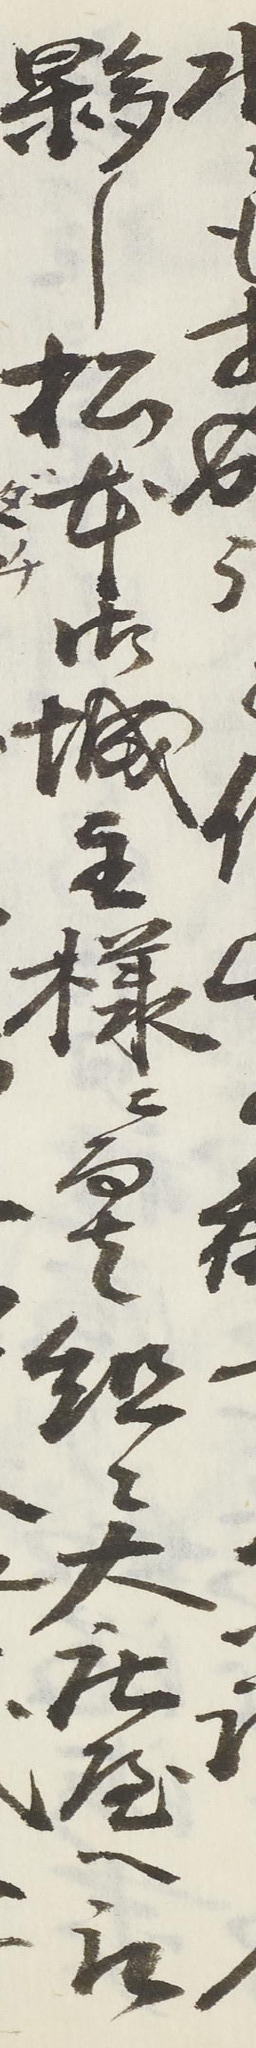夥し松本御城主様二而は組々大庄屋へ被
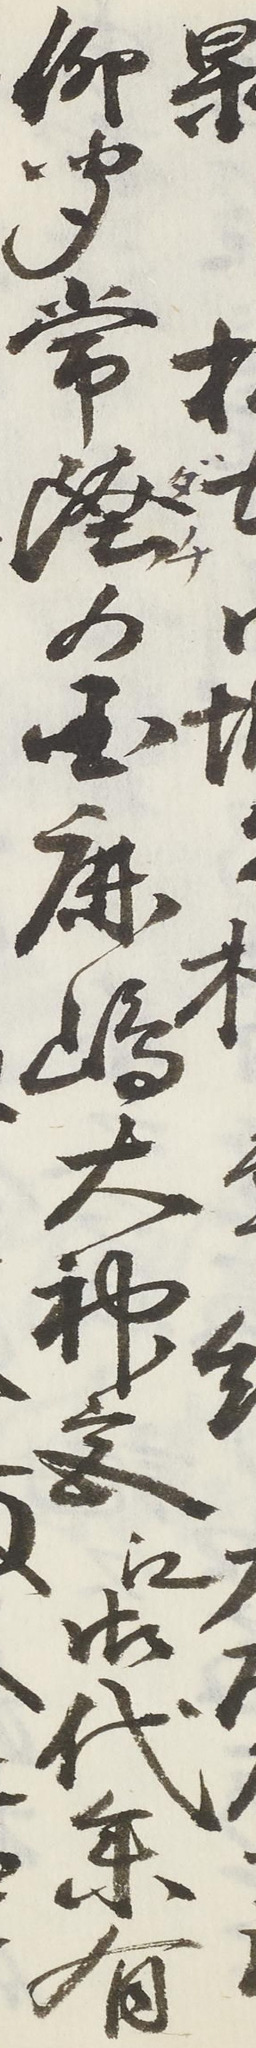仰聞常陸の国鹿嶋大神宮江御代参有
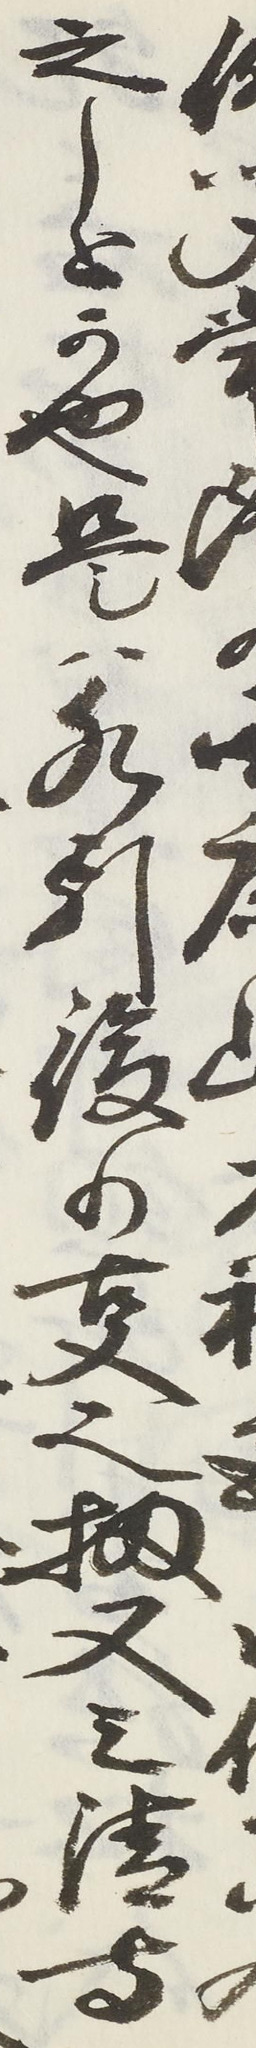之しとかや是ハ水引後の事也扨又三清寺
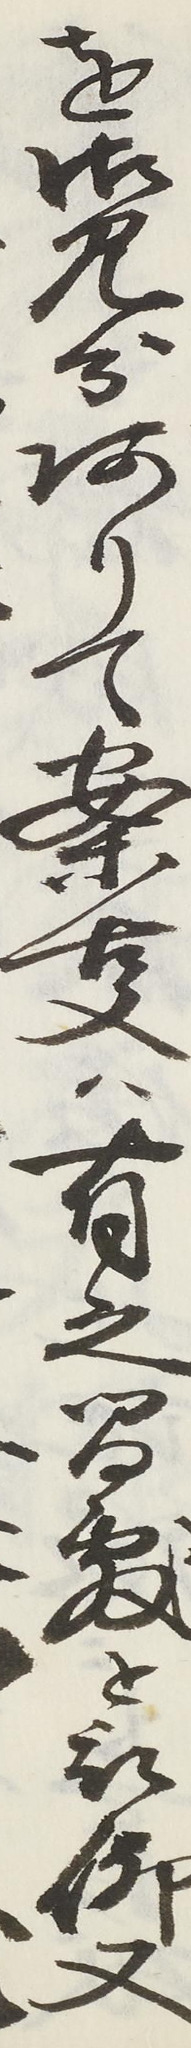を御見分ありて案事ハ有之間敷と被仰又
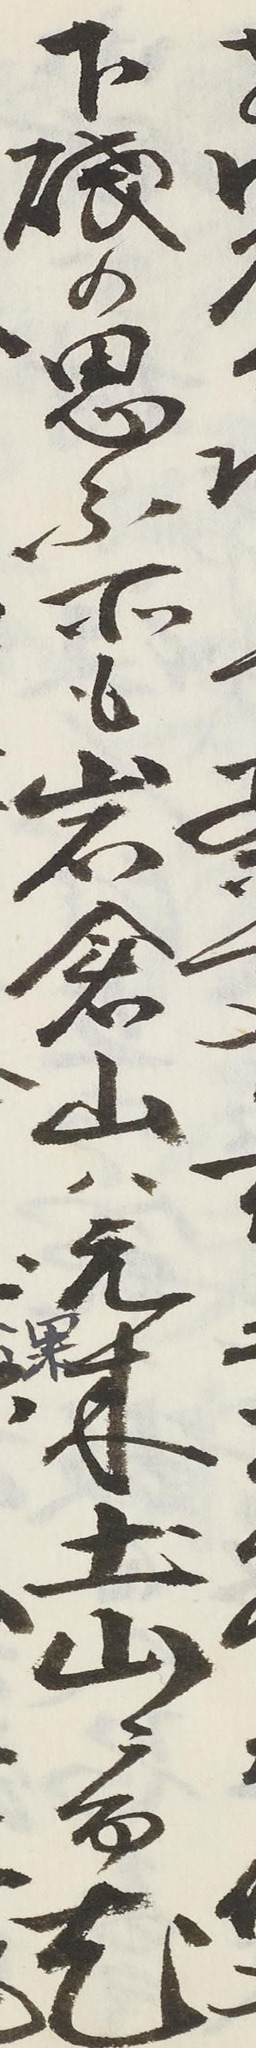下賤の思ふ所も岩倉山ハ元来土山二而尤
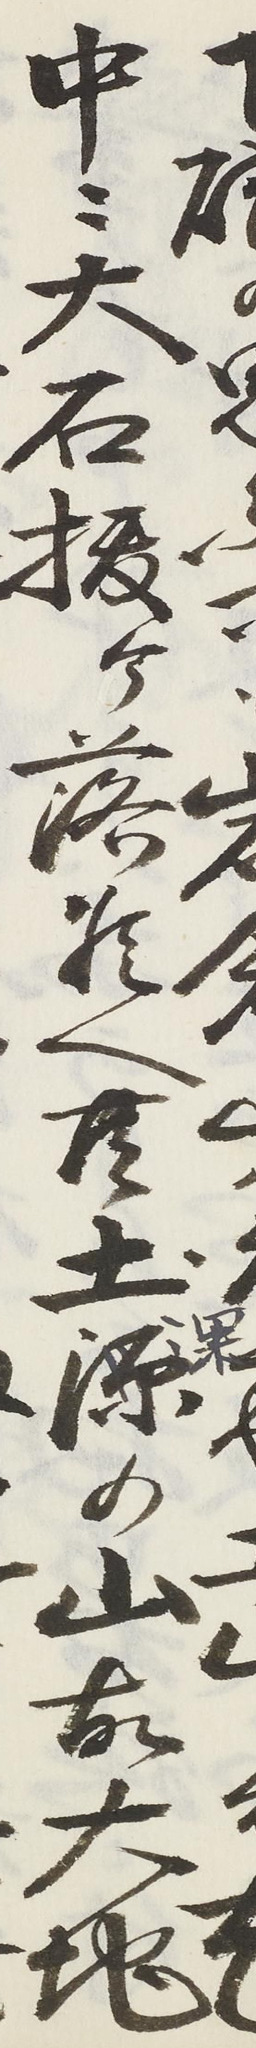中二大石抜ヶ落候へ共土源の山故代大地
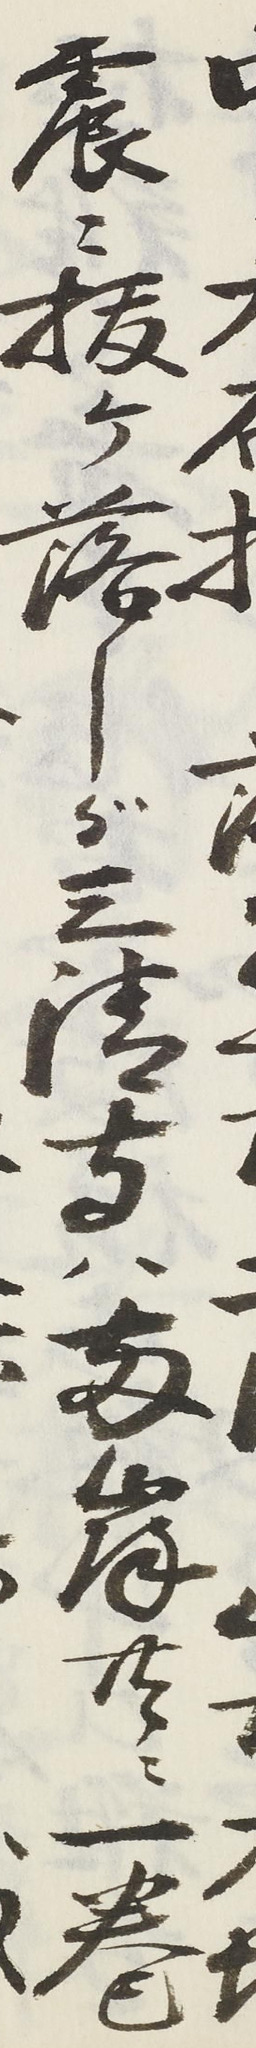震二抜ヶ落しが三清寺ハ両岸共二一巻
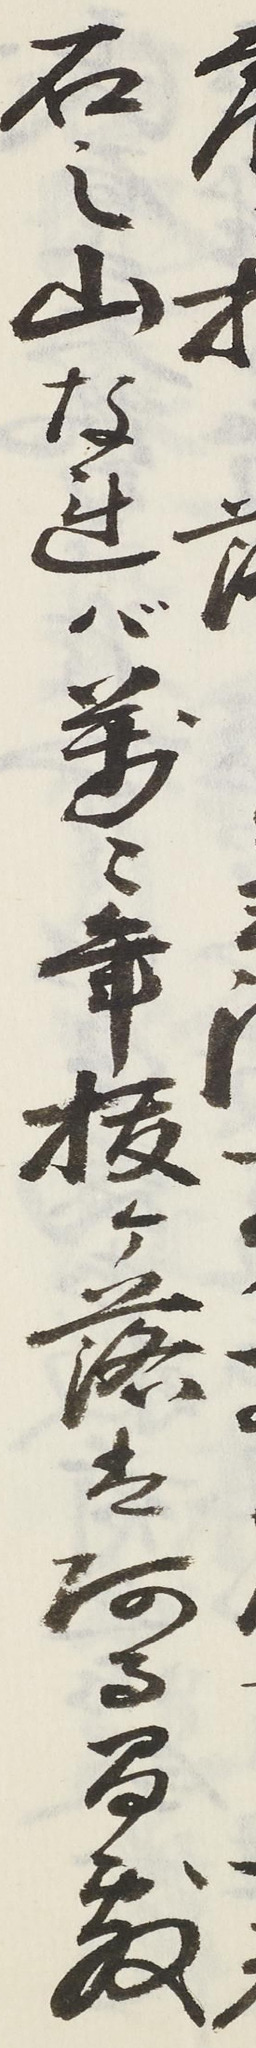石之山なれバ万々年抜ヶ落はある間敷
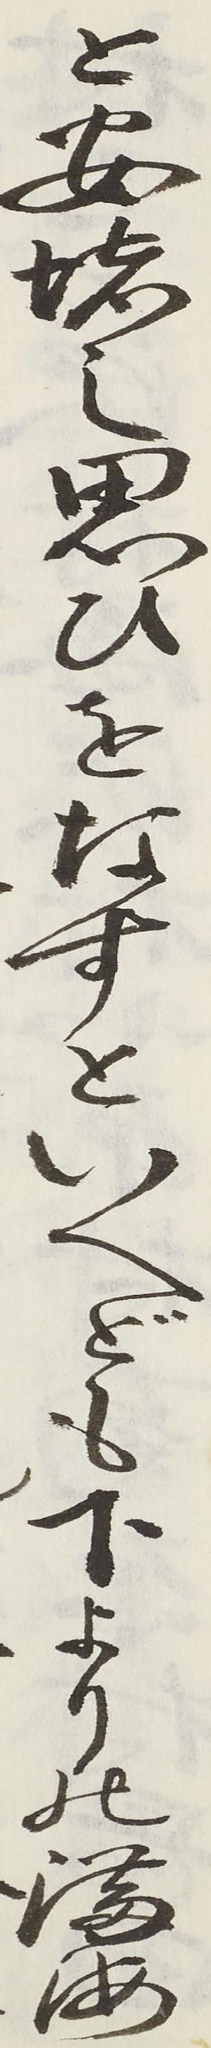と安堵之思ひをなすといへども下よりの満海
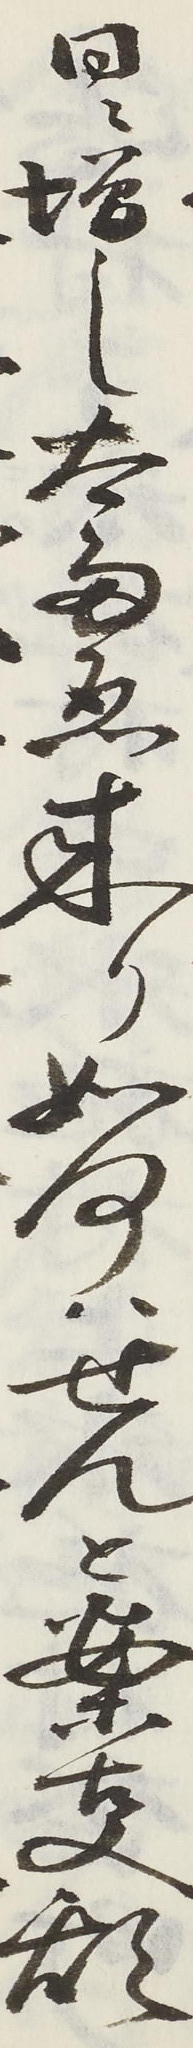日々増したたゑ来り如何ハせんと案事煩
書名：弘化四年地震記
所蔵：東京大学地震研究所図書室 Earthquake Research Institute Library, The University of Tokyo, JAPAN
